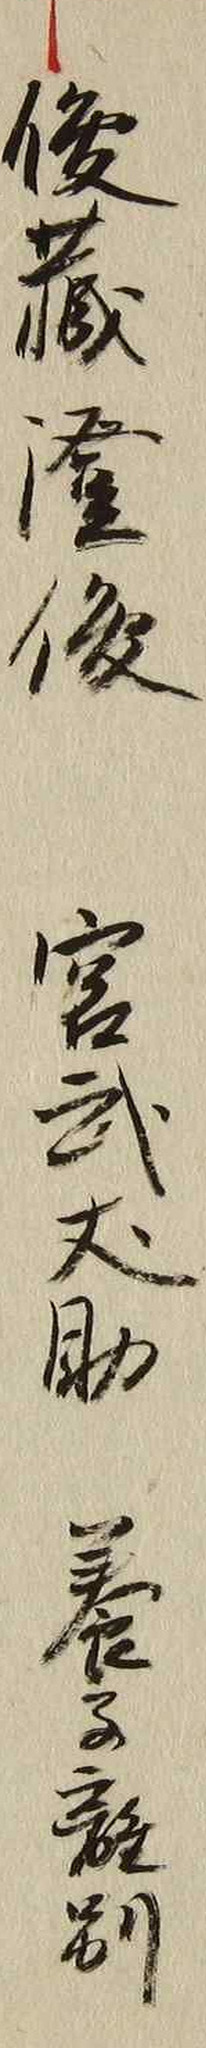俊蔵澄俊宮武丈助養子離別
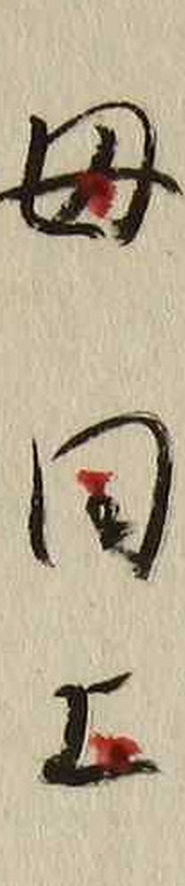母同上
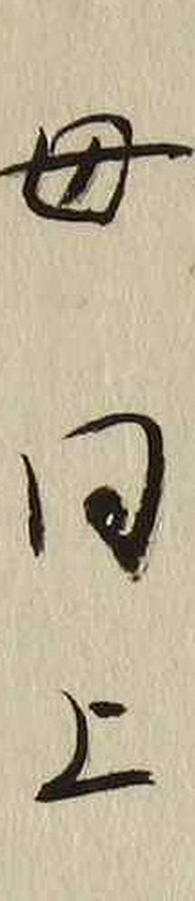母同上
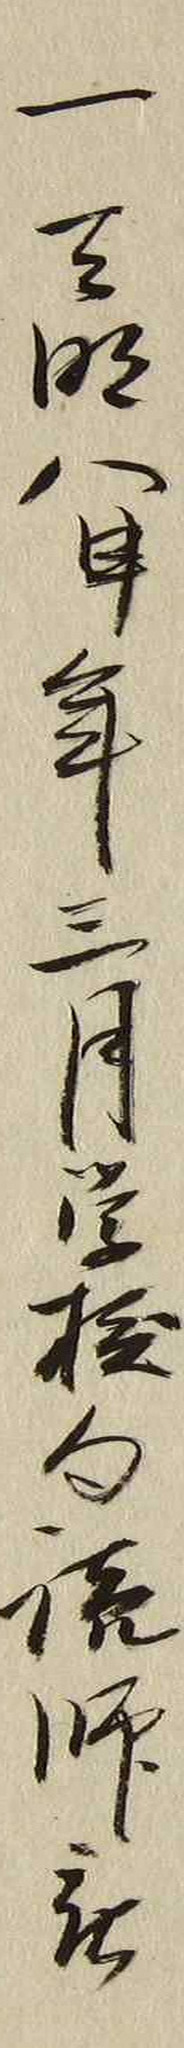一天明八申年三月学校句読師被
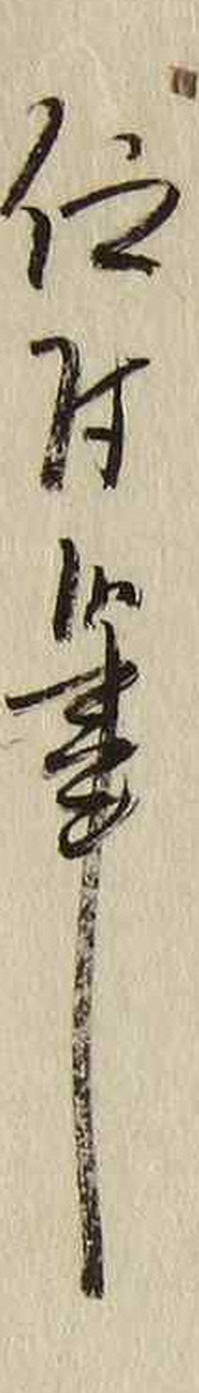仰付候事
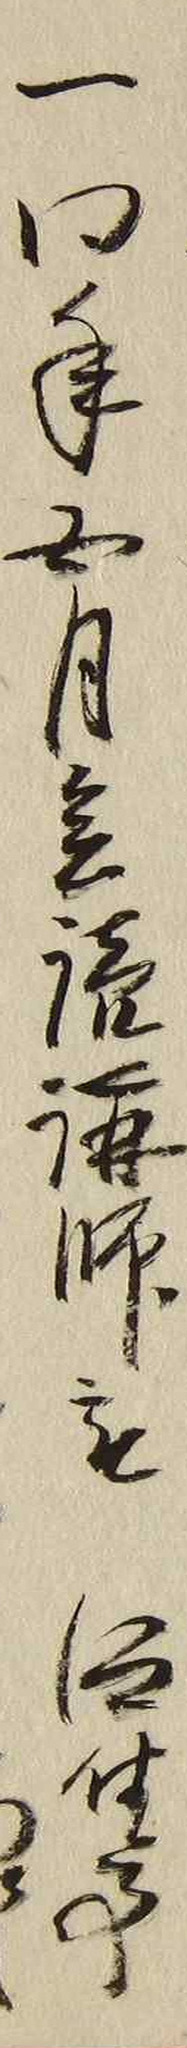一同年五月会読講師被仰付候事
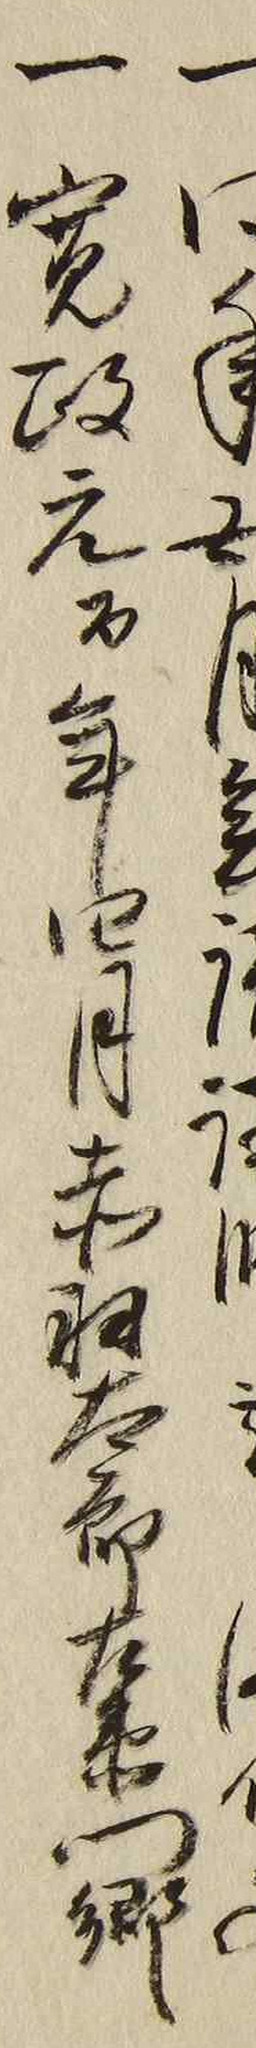一寛政元酉年四月赤羽太節左衛門郷

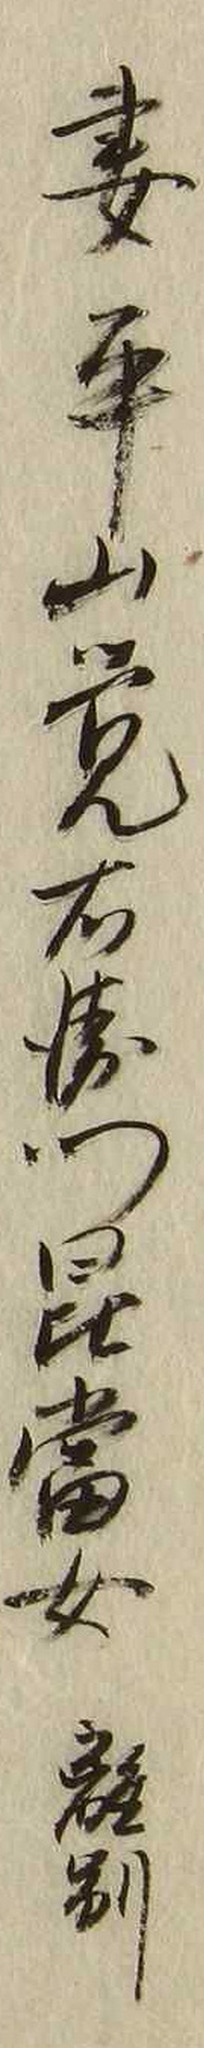妻平山覚右衛門昆当女離別
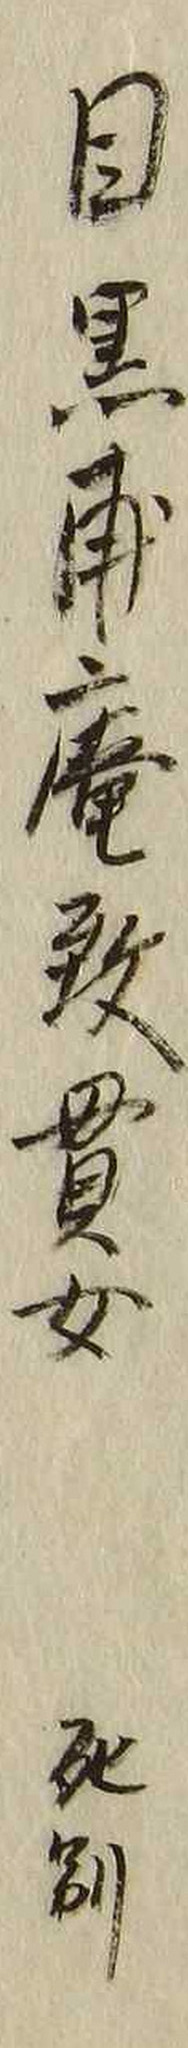目黒甫庵致貫女死別
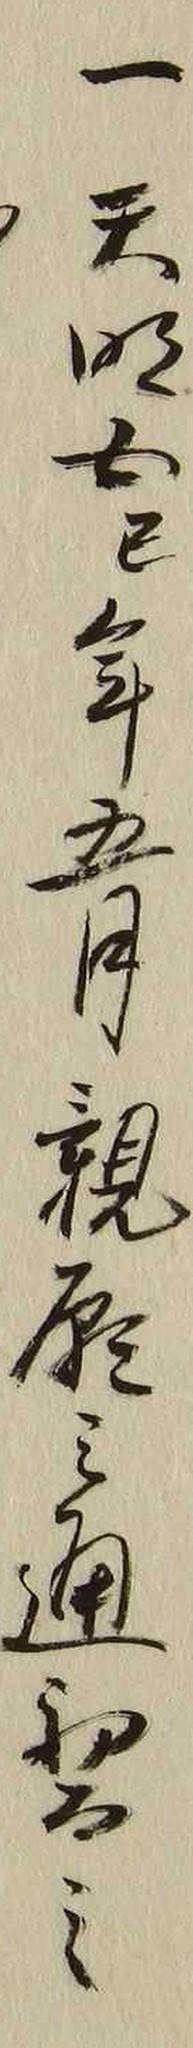一天明五巳年五月親願之通初而之
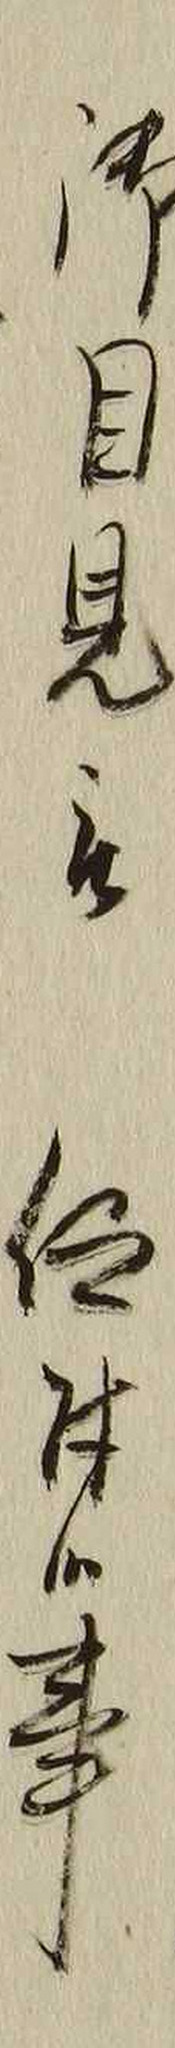御目見被仰付候事
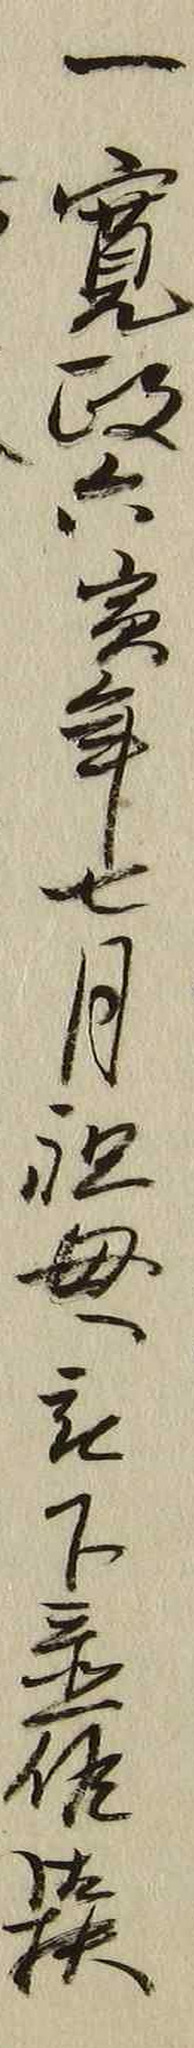一寛政六寅年七月祖母へ被下置候御扶
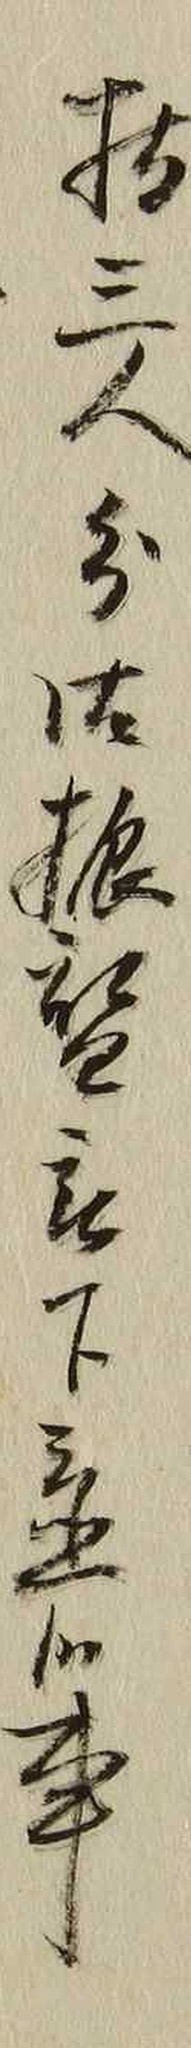持三人分御振替被下置候事
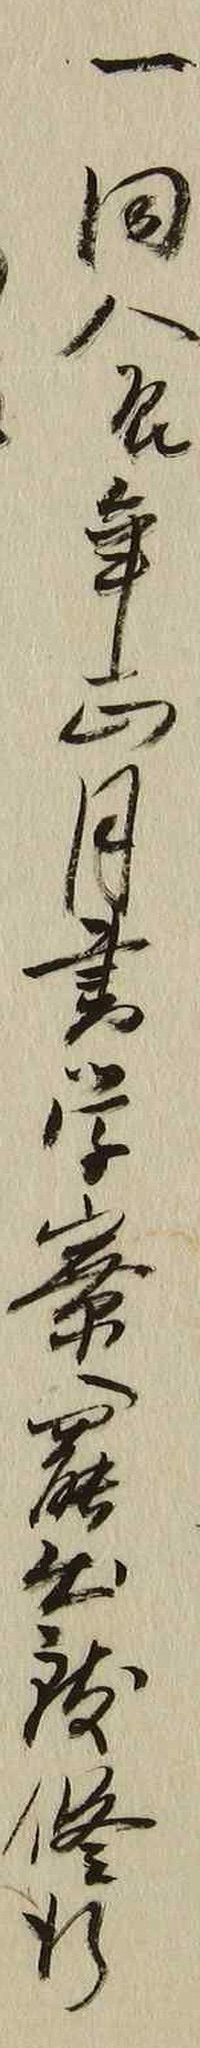一同八辰年正月書学寮へ罷出致修行
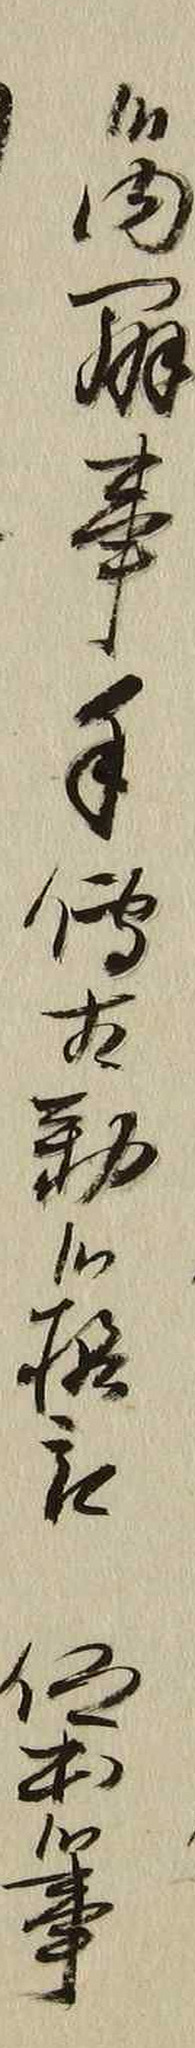候内弁事手伝相勤候様被仰出候事
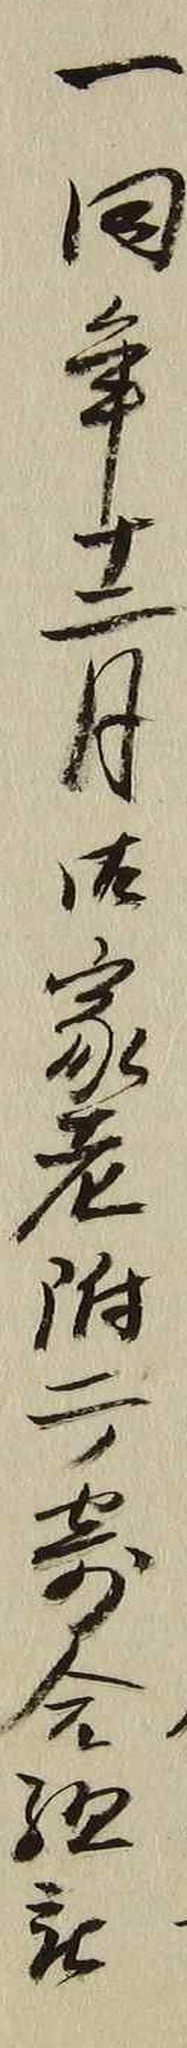一同年十二月御家老附二ノ寄合組被
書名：諸士系譜　巻之349　も之部5
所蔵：会津若松市立会津図書館
